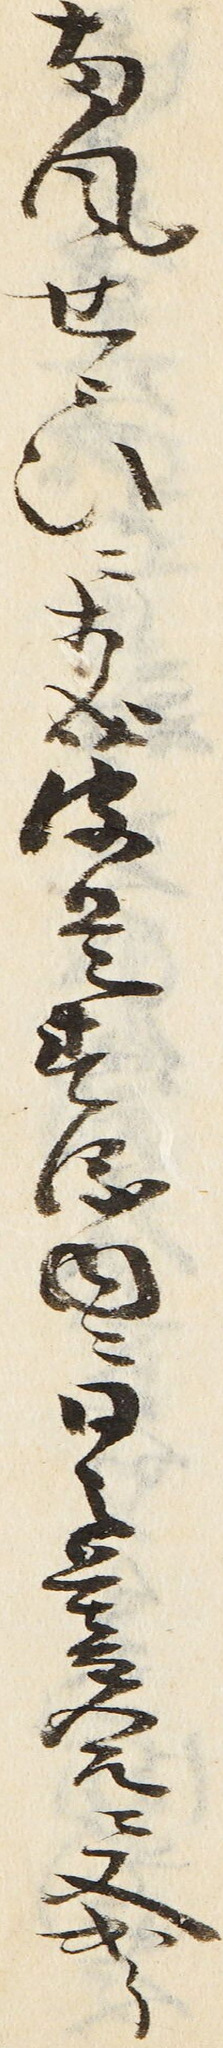南風せ候ひニ相成彼是する内ニ日之暮合ニ又出候
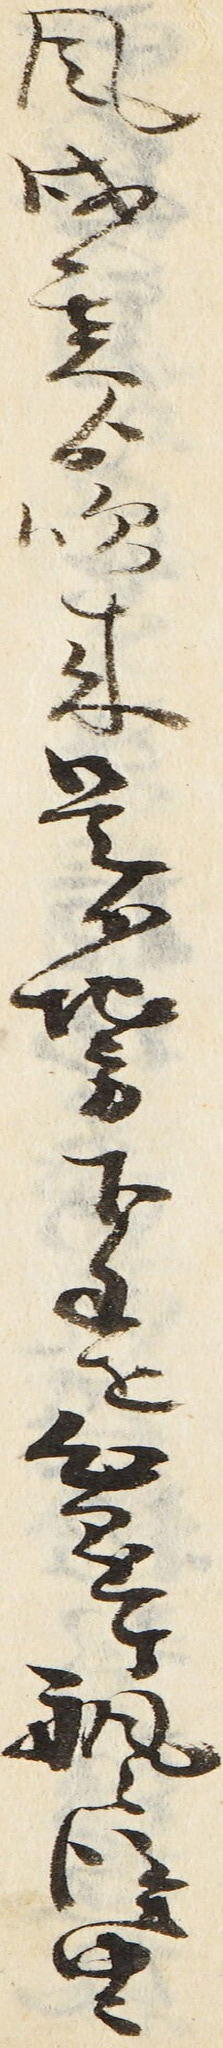風戌亥ゟ吹来是ゟ地方下手を心懸ケ䑺候得共中々
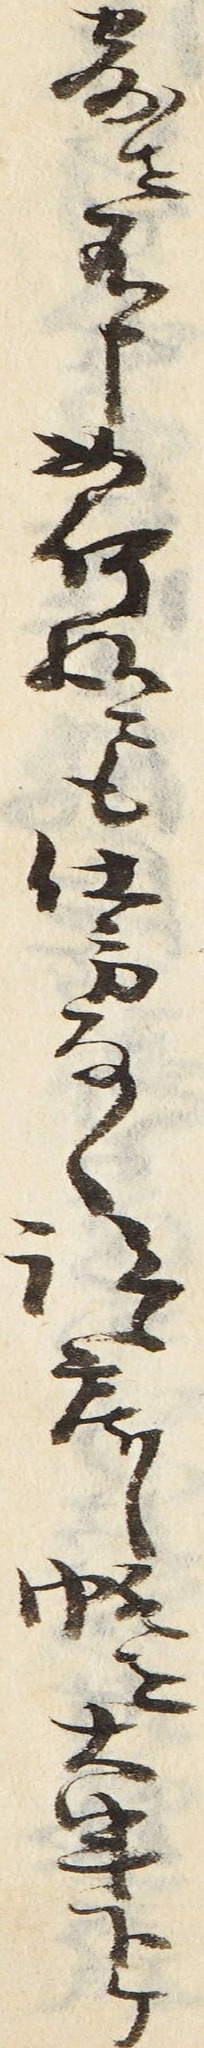寄せ不申如何様ニも仕方なく跡へ戻し帆を大半下ケ
